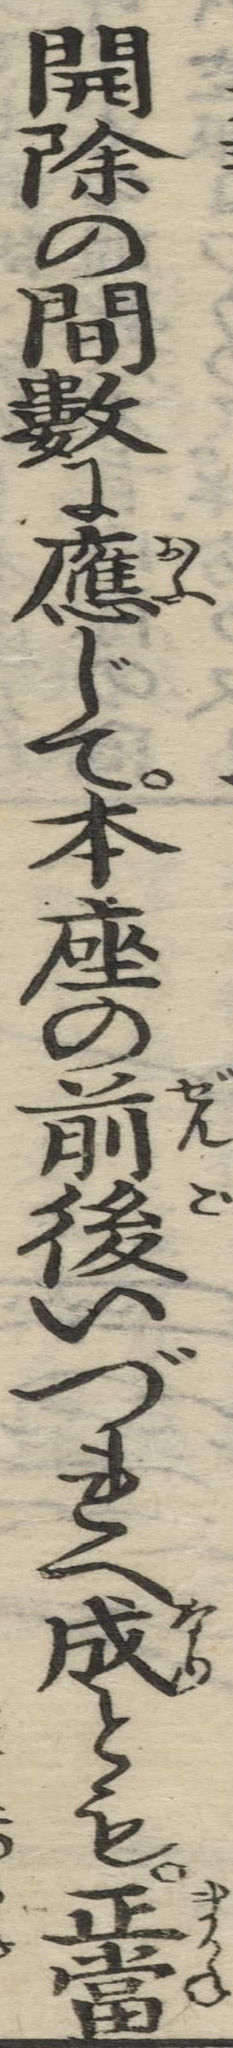開除の間数に応じて。本座の前後いづれへ成とも。正当
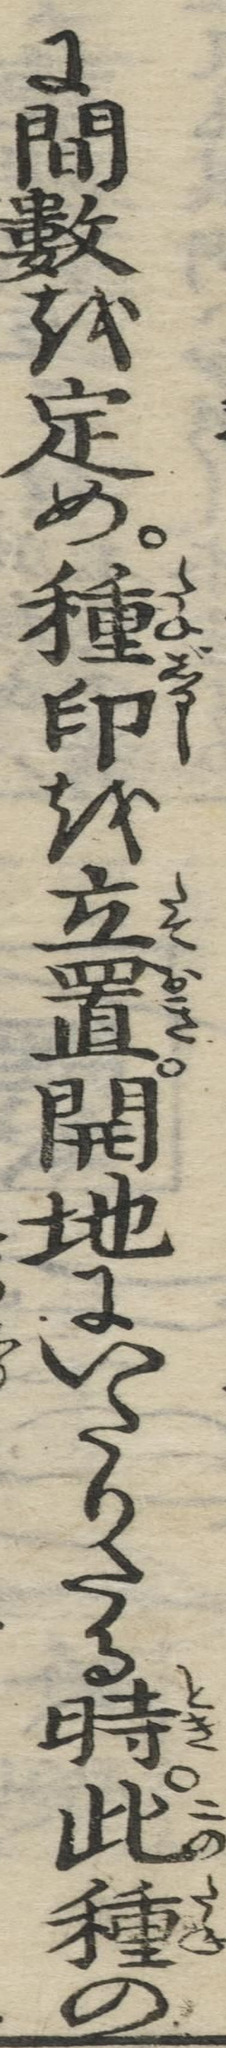に間数を定め。種印を立置開地にいたりたる時。此種の
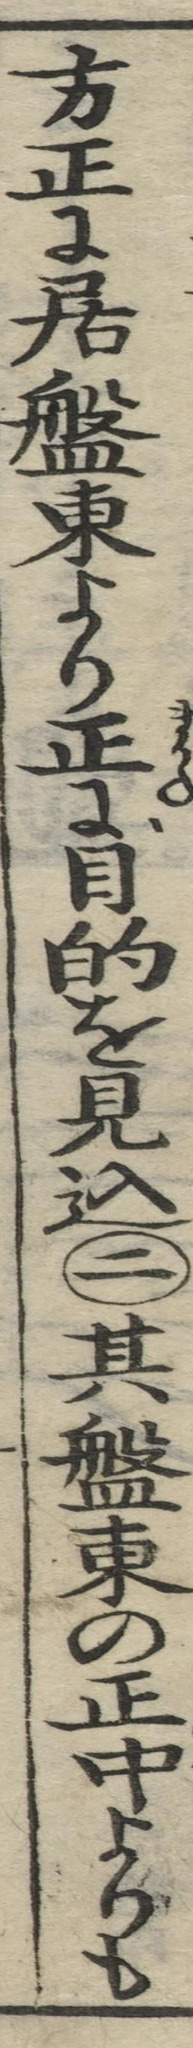方正に居盤東より正に目的を見込㊁其盤東の正中よりも

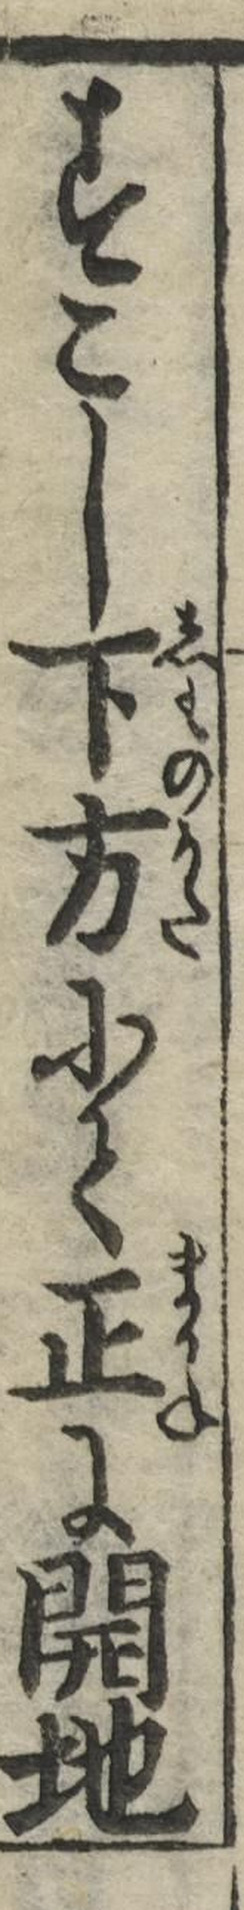すこし下方にて正に開地
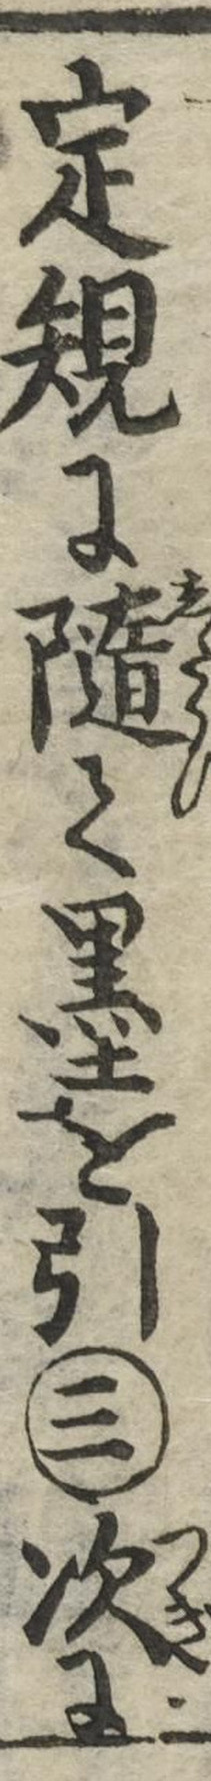定規に隨て墨を引㊂次に
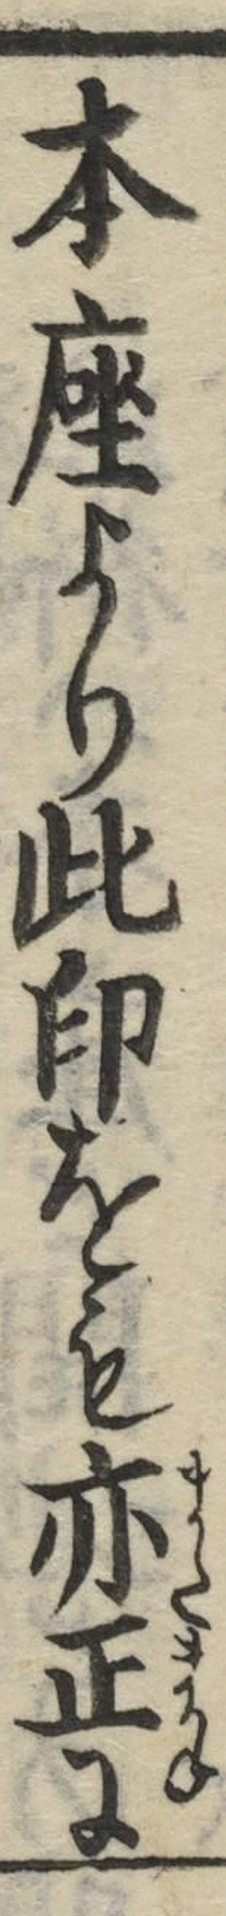本座より此印をも亦正に
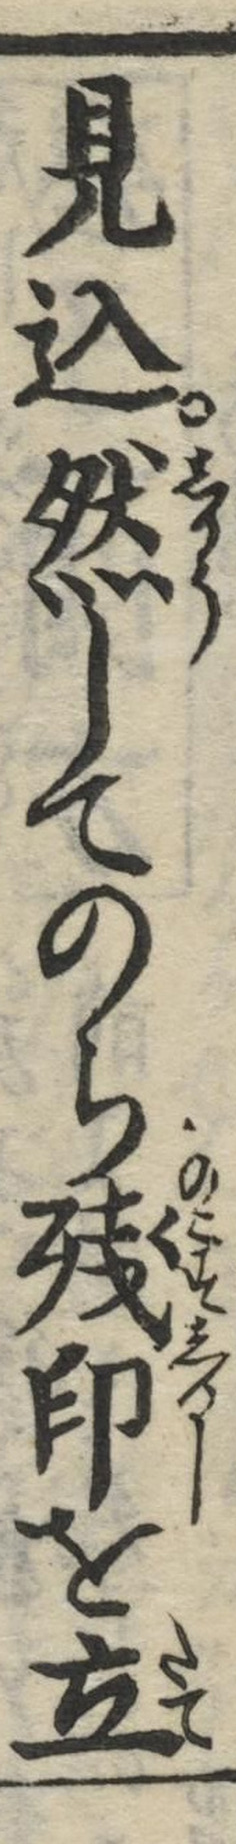見込。然してのち残印を立
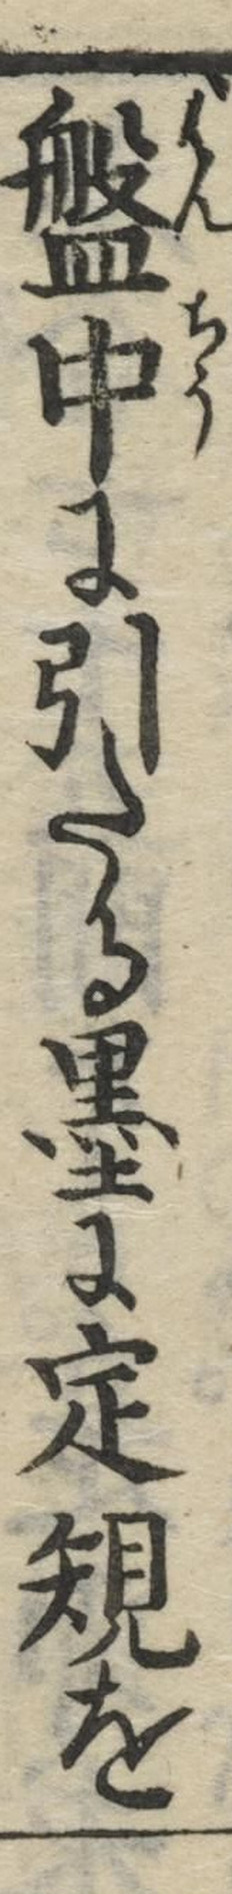盤中に引たる墨に定規を
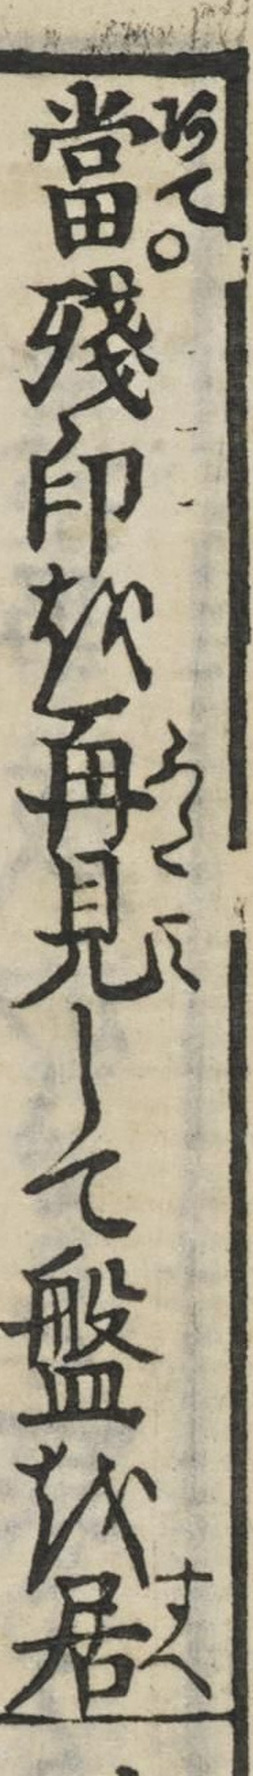當。残印を再見して盤を居
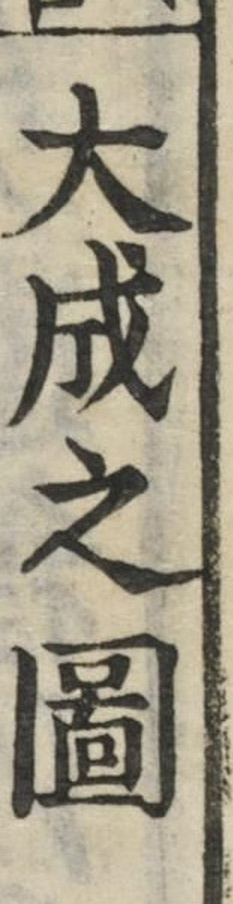大成之圖
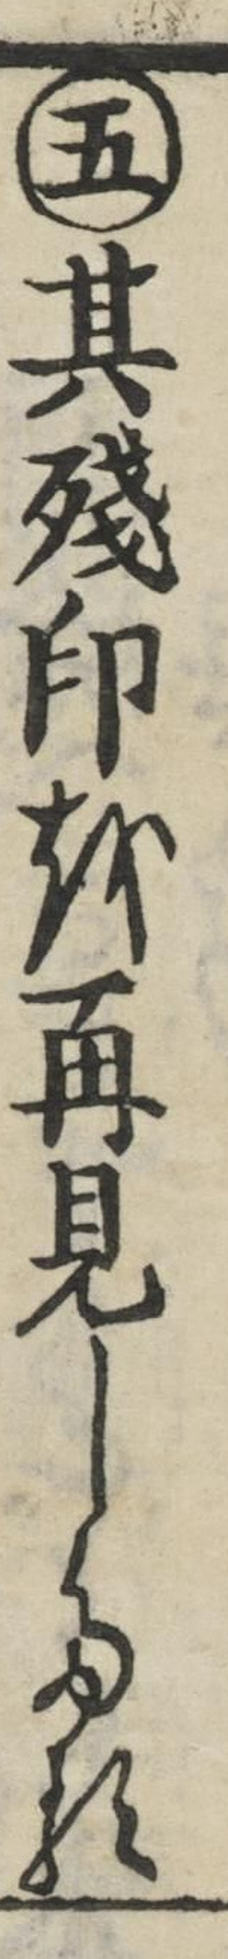㊄其残印を再見したる
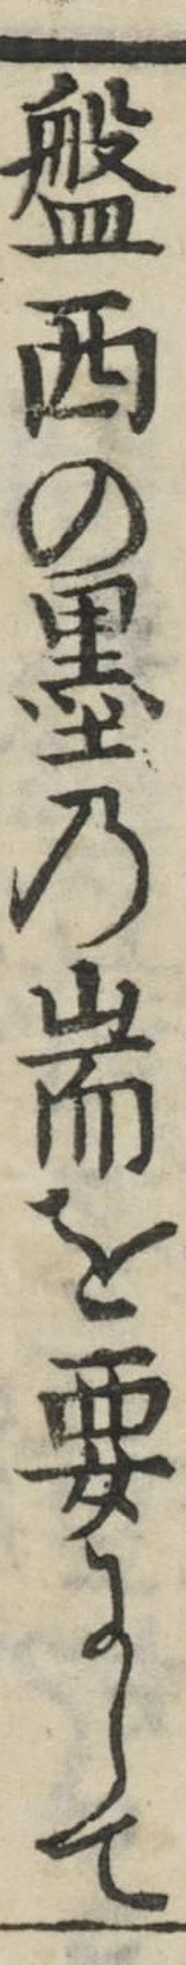盤西の墨の耑を要にして
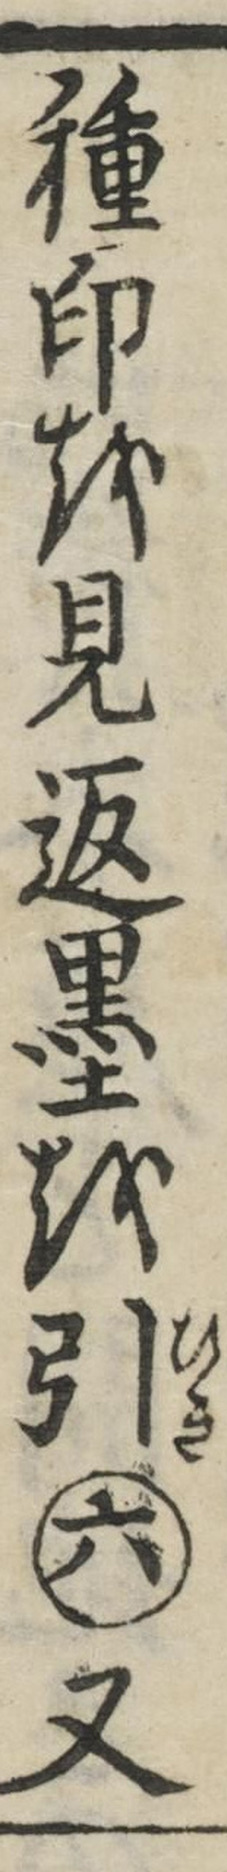種印を見返墨を引㊅又
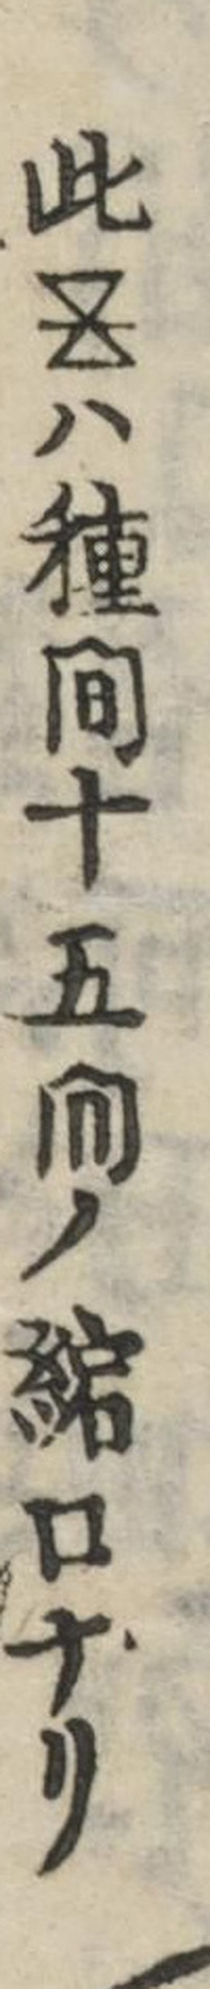此▽△ハ種間十五間ノ縮口ナリ
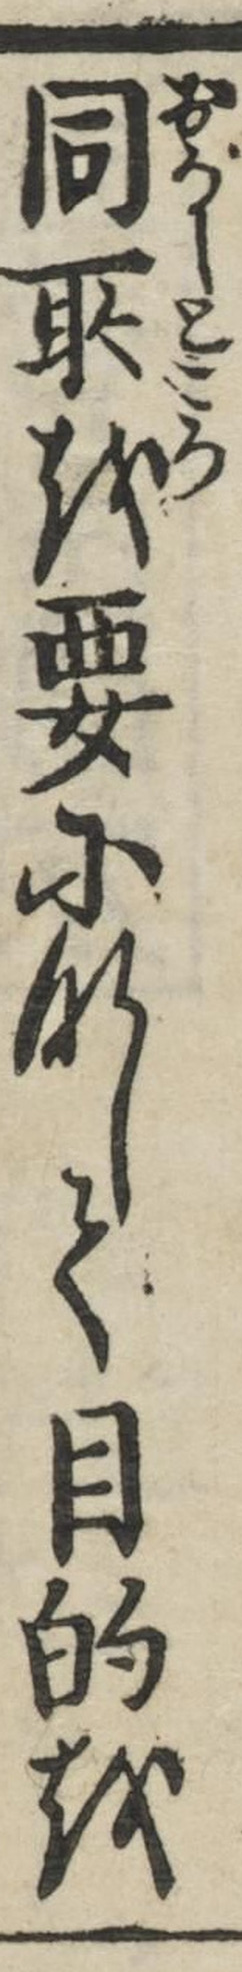同所を要になして目的を
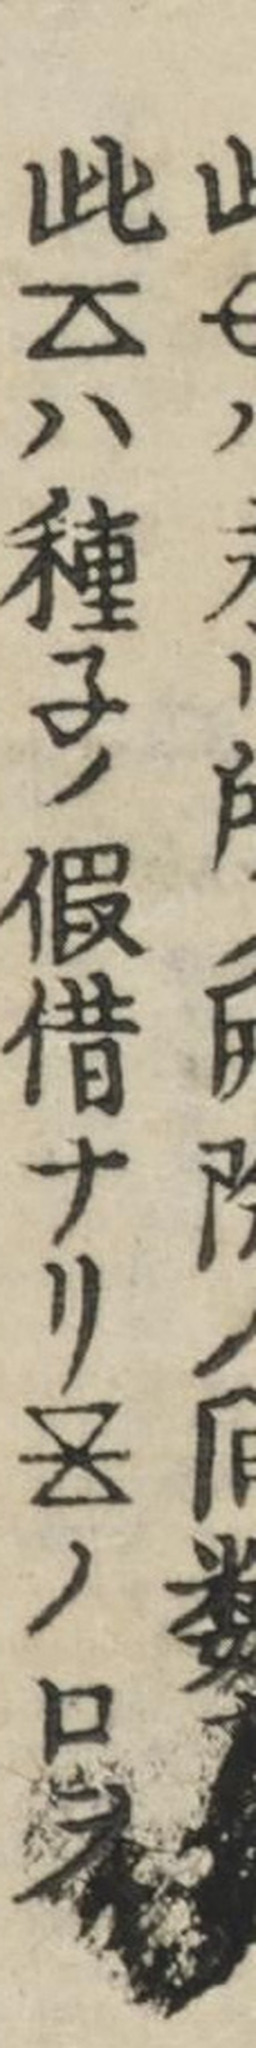此△ハ種子ノ假借ナリ▽△ノ口ヲ
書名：量地指南　巻之二（内題）
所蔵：東京大学地震研究所図書室 Earthquake Research Institute Library, The University of Tokyo, JAPAN
